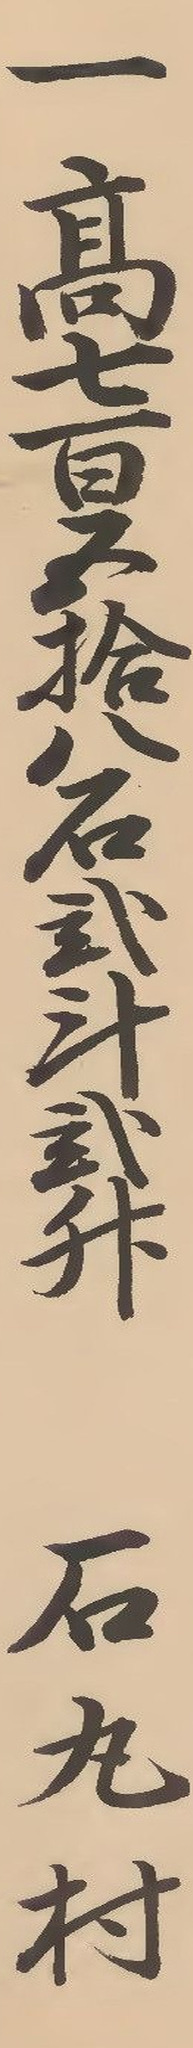一高七百五拾八石弐斗弐升石丸村
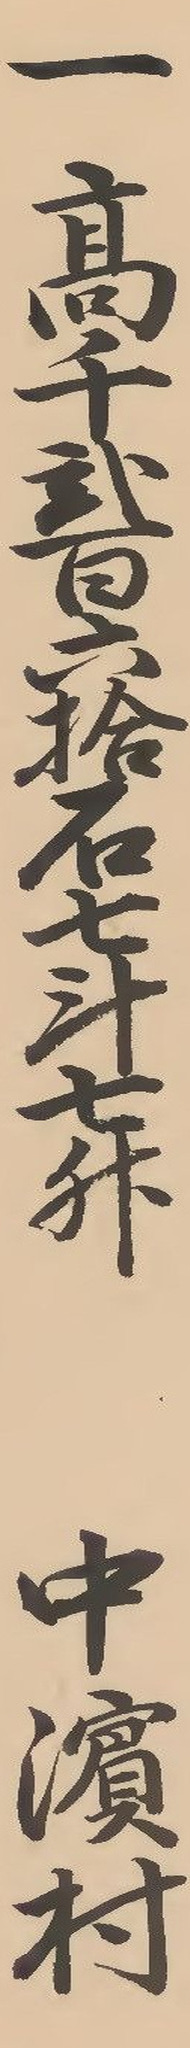一高千弐百六拾石七斗七升中浜村
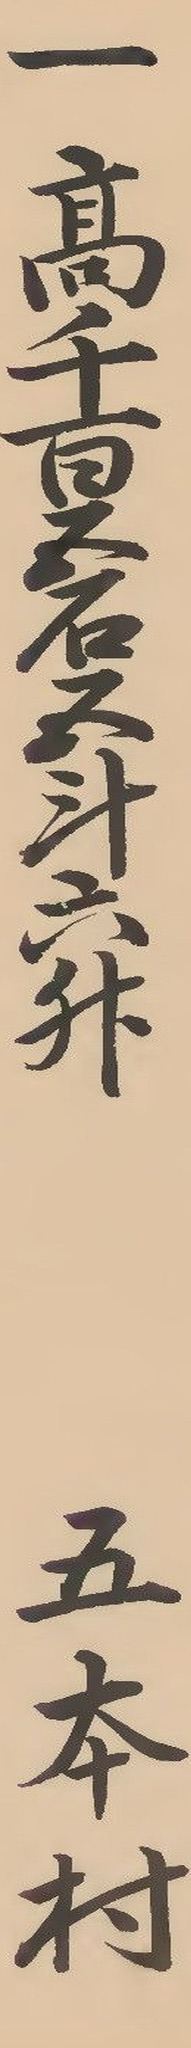一高千百五石五斗六升五本村

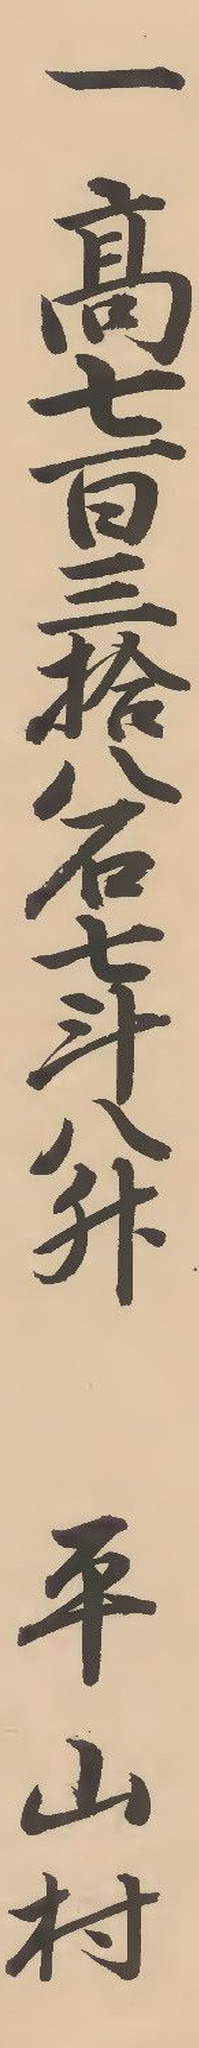一高七百三拾八石七斗八升平山村
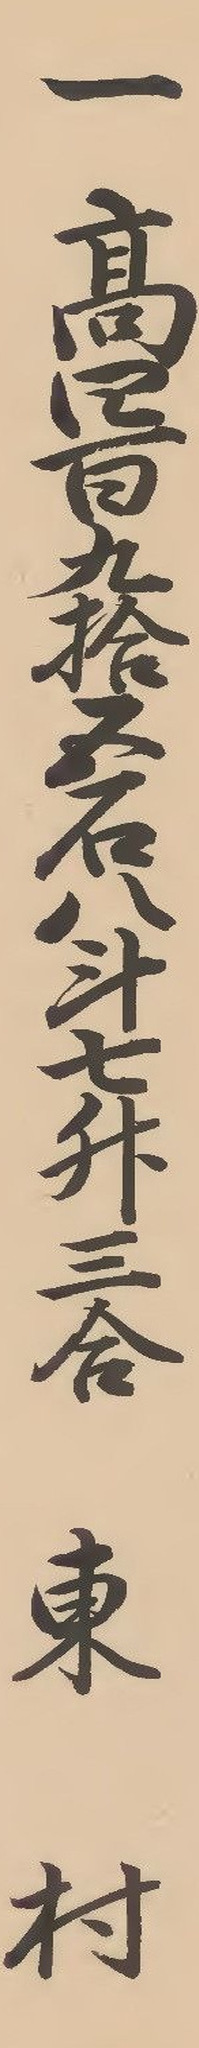一高四百九拾五石八斗七升三合東村
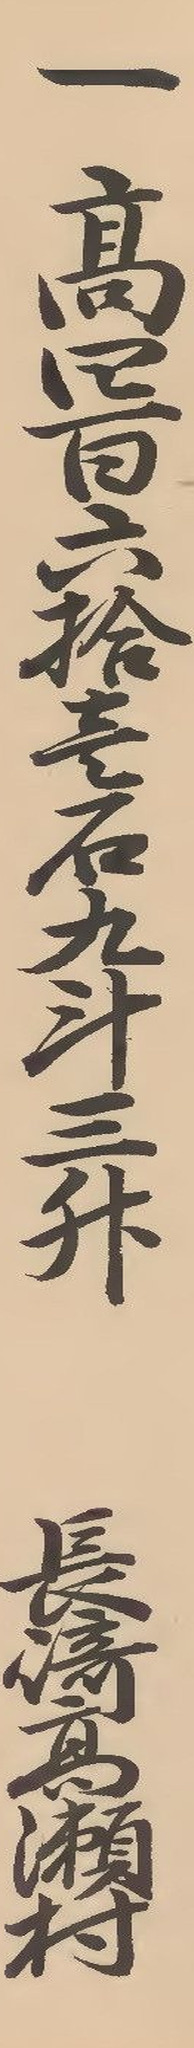一高四百六拾壱石九斗三升長崎高瀬村
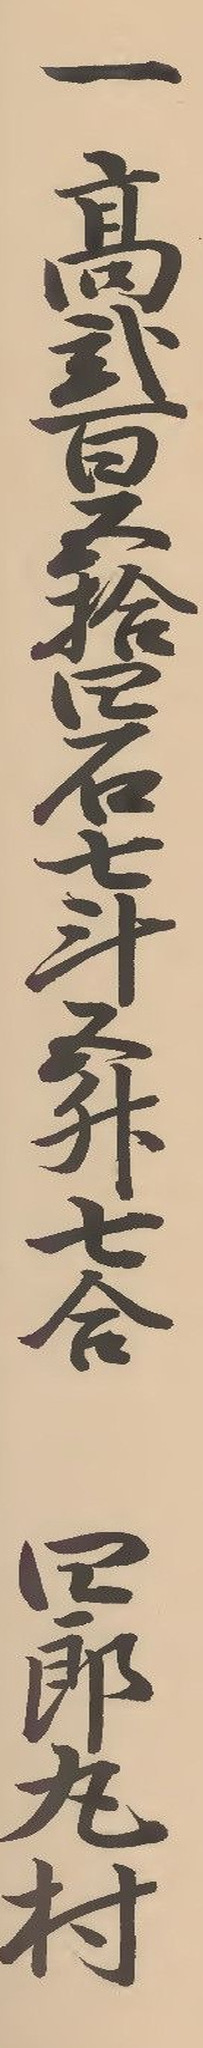一高弐百五拾四石七斗五升七合四郎丸村
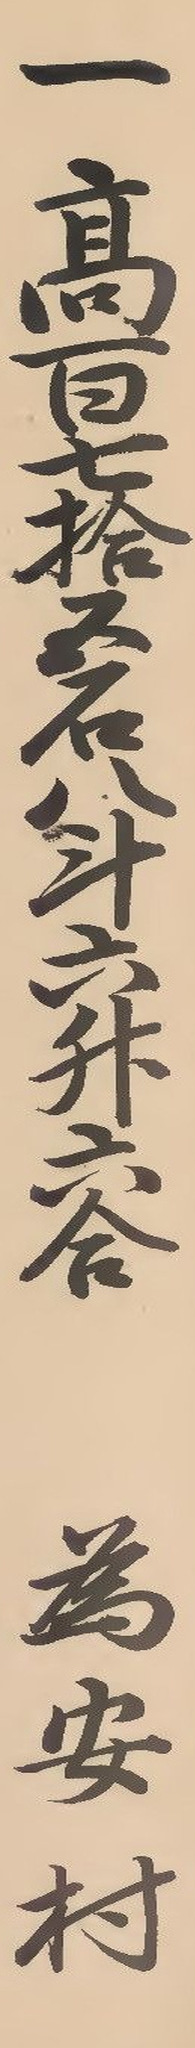一高百七拾五石八斗六升六合為安村
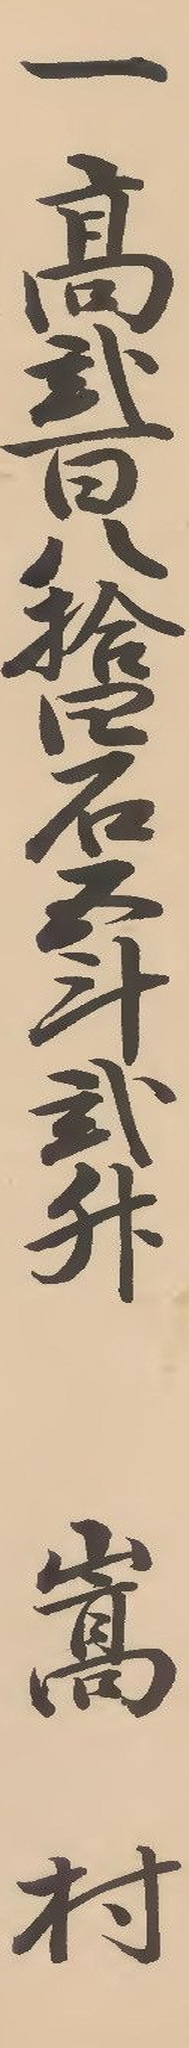一高弐百八拾四石五斗弐升嵩村
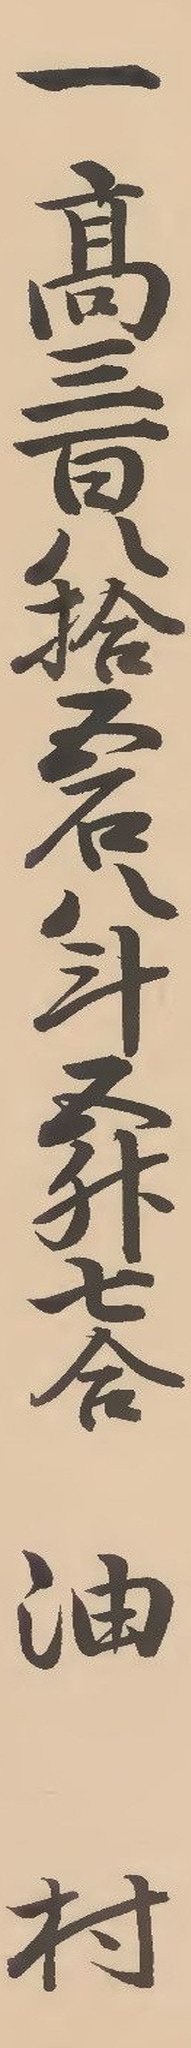一高三百八拾五石八斗五升七合油村
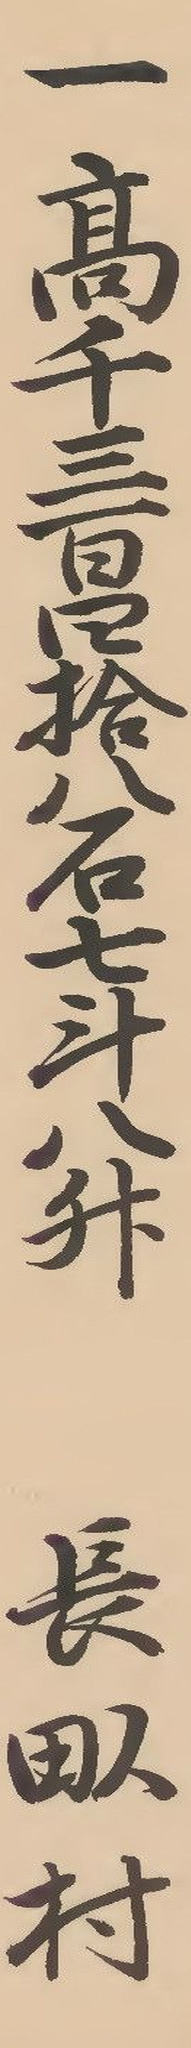一高千三百四拾八石七斗八升長畝村

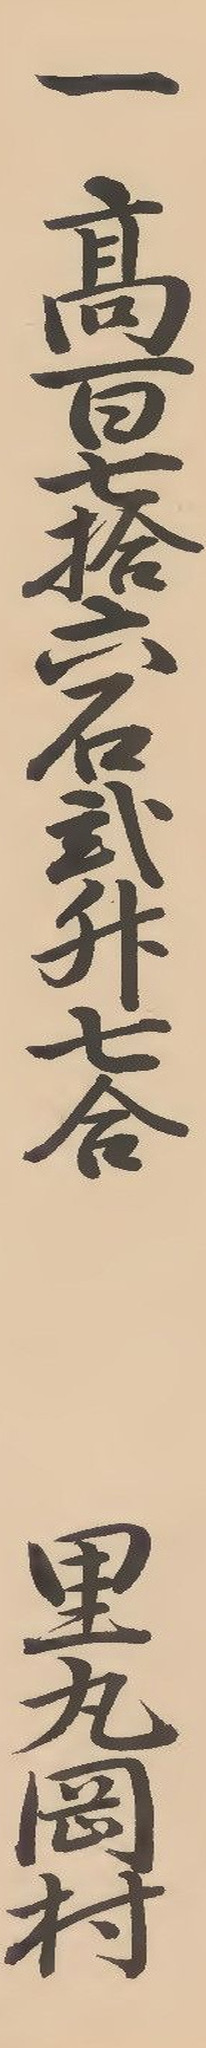一高百七拾六石弐升七合里丸岡村
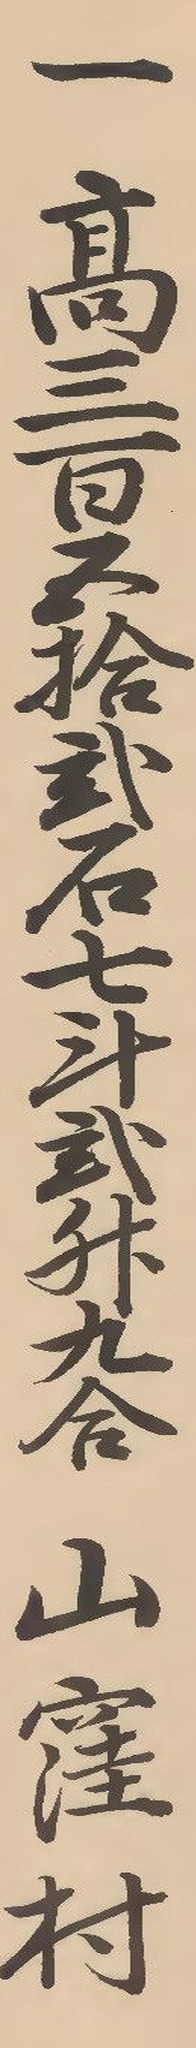一高三百五拾弐石七斗弐升九合山窪村
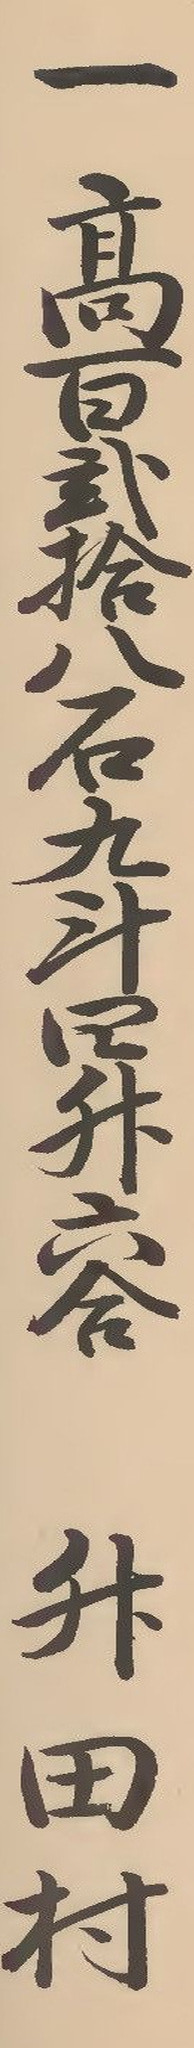一高百弐拾八石九斗四升六合升田村
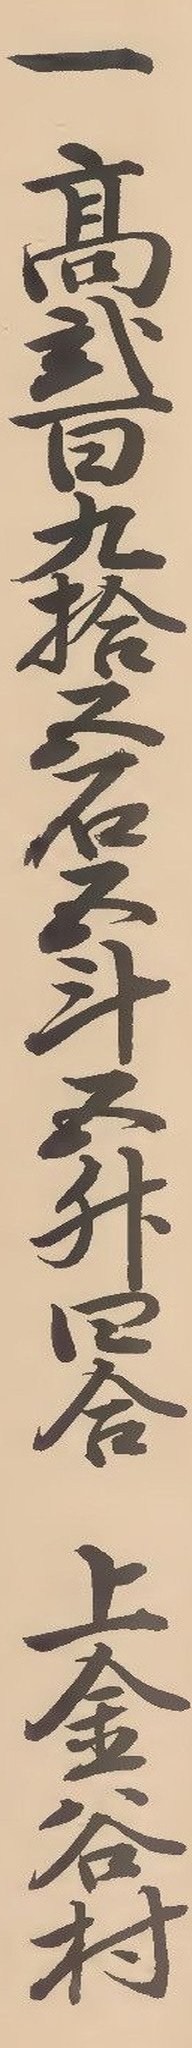一高弐百九拾五石五斗五升四合上金谷村
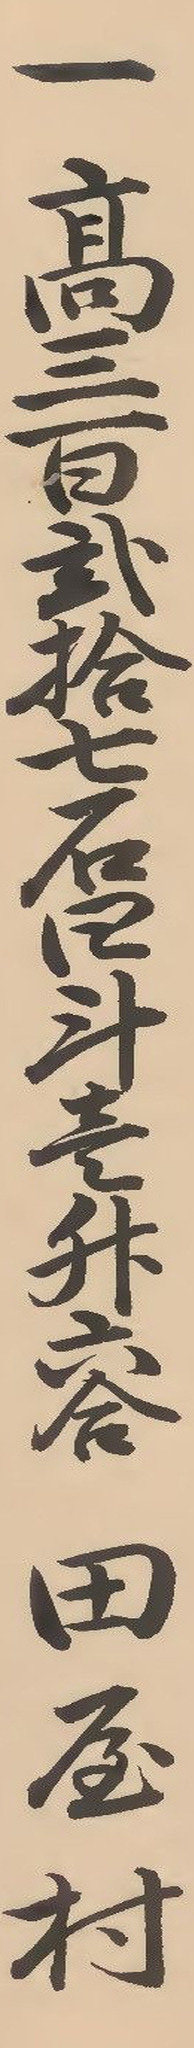一高三百弐拾七石四斗壱升六合田屋村
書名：越前国郷帳
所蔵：国立公文書館 National Archives of Japan
